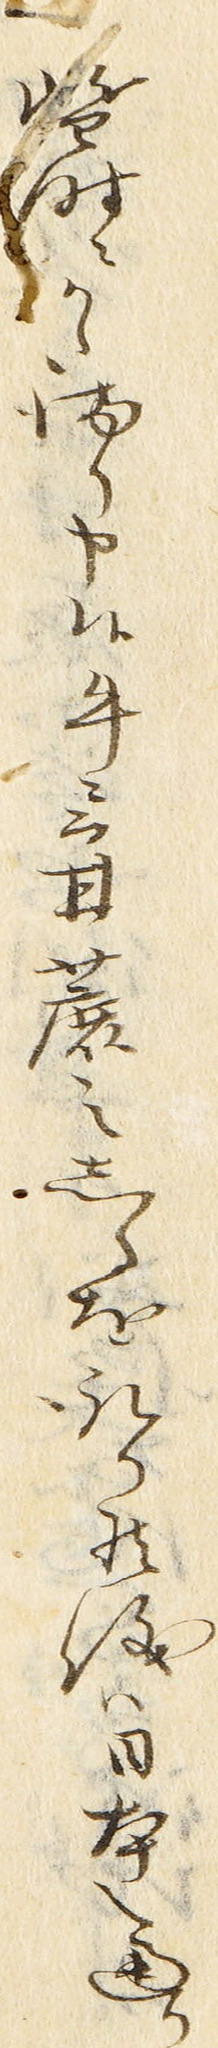此わ時々かたまり申候牛に而甘蔗之しるを取り候儀は日本の通り
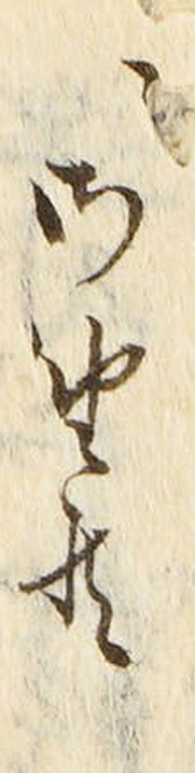御座候
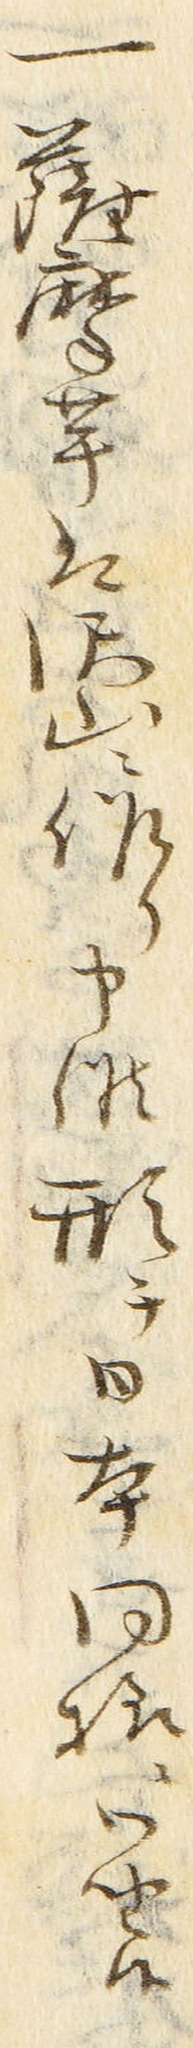一薩摩芋は沢山に作り申候形ち日本同様二御座候
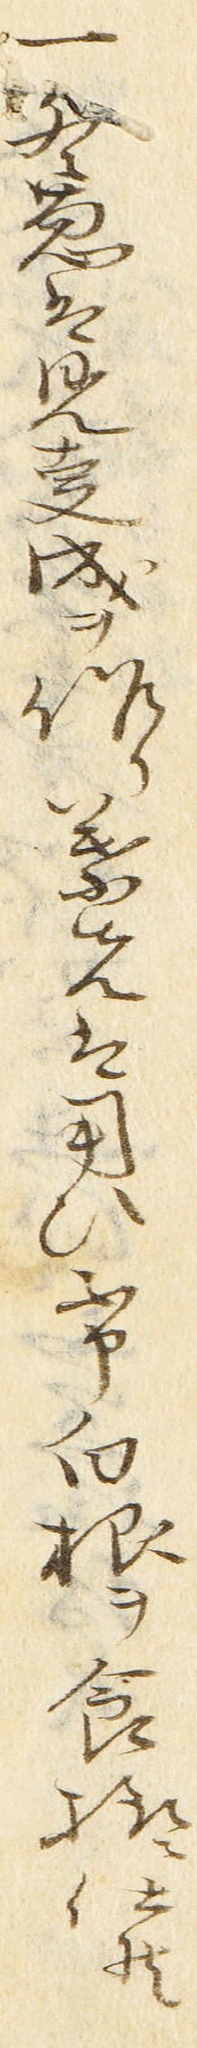一冬葱は見事成を作り葉先は用ひ不申白根ヲ食様に仕候
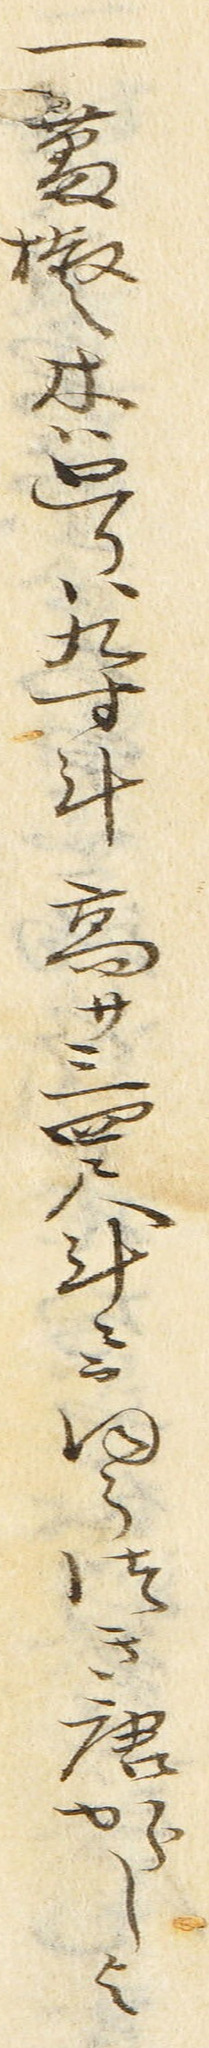一蕃椒之木は廻りは九寸斗高さ三四尺斗に而同うつき唐からしと

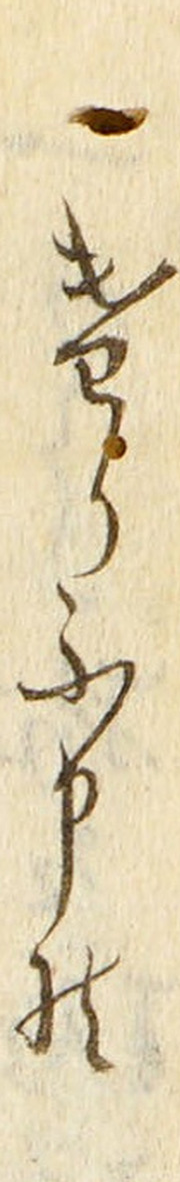出わり不申候
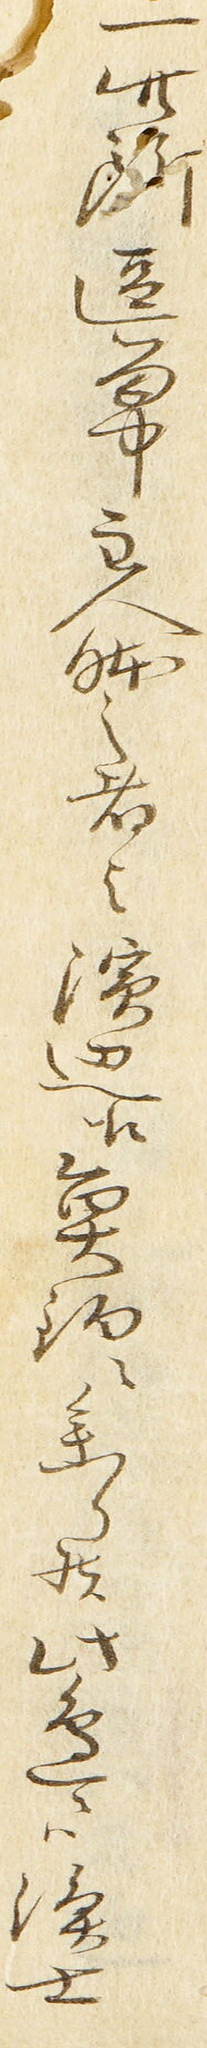一此所逗留中主人躰之者と浜辺え魚釣に参り候此辺は漁士
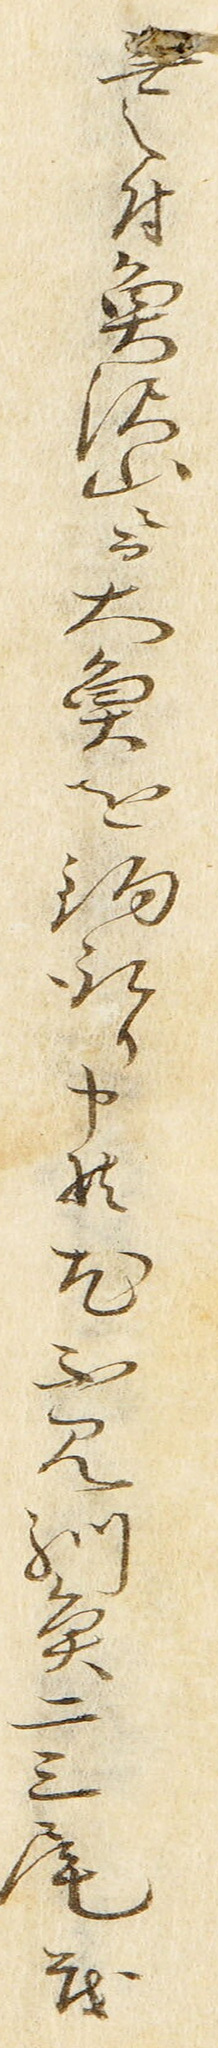無之付魚沢山に而大魚を釣取り申候尤不見馴魚二三尾も
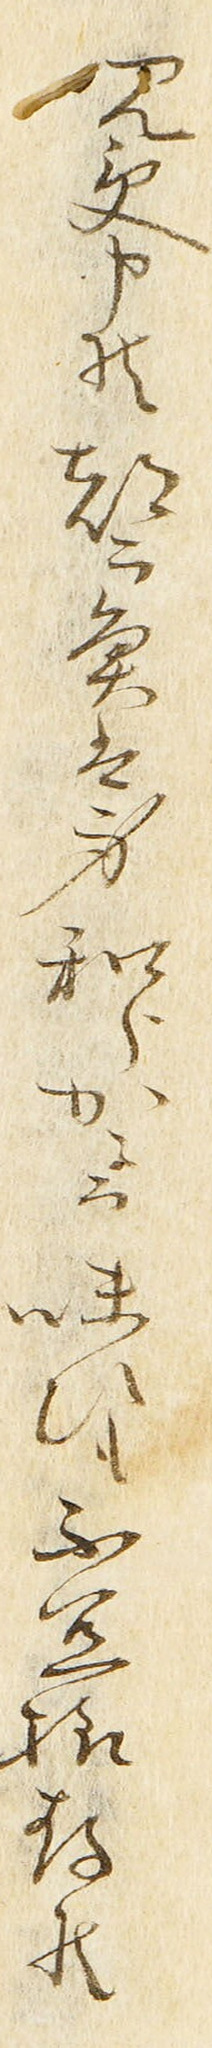見受申候却而魚は身和らかに而味ひも不宜様存候
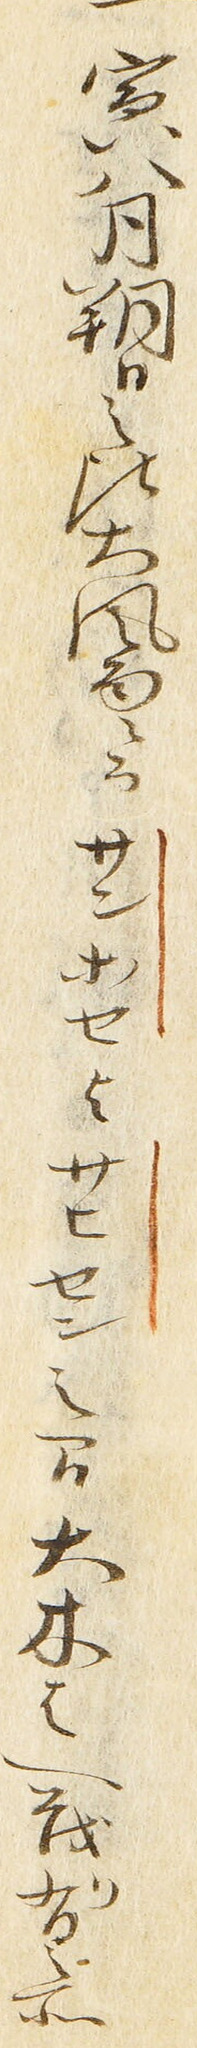一寅八月朔日之頃風雨にてサンホセとサヒセン之間大木は一茂り有之所
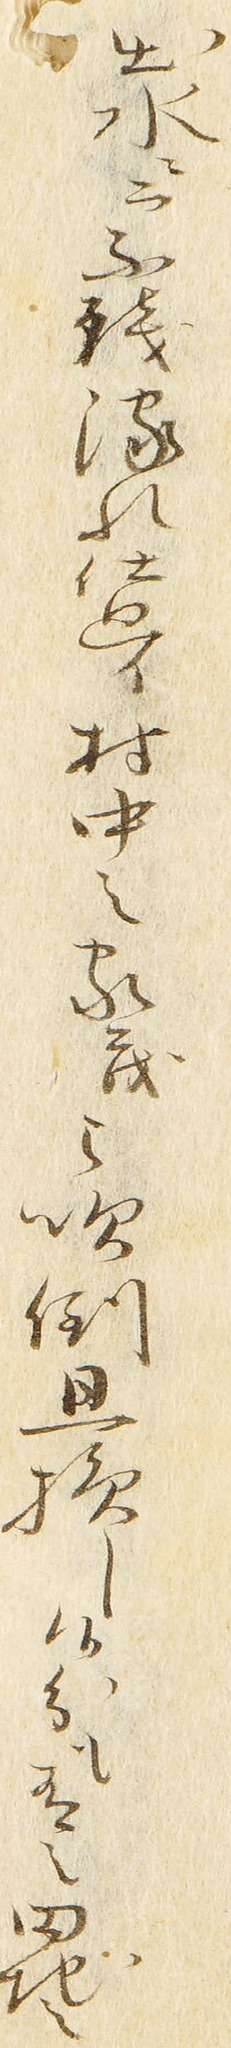出水に而不残流れ仕廻り村中之家も之吹倒且損し候分も有之田地之
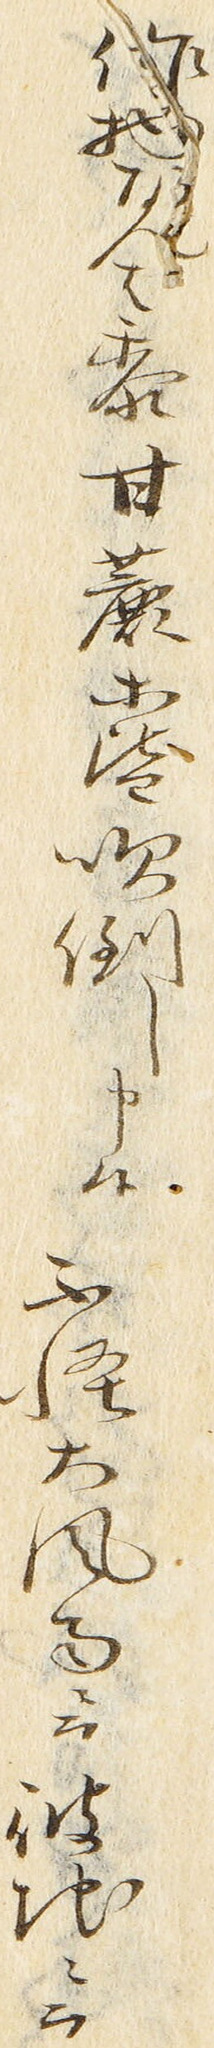作物なとは黍甘蔗等皆吹倒し申候不怪大風雨に而彼地に而
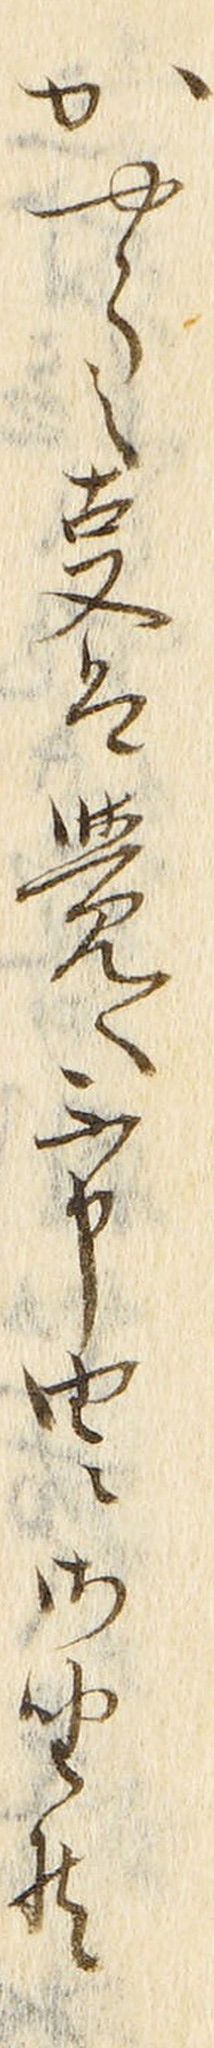かやう事は覚へ不申由に御座候
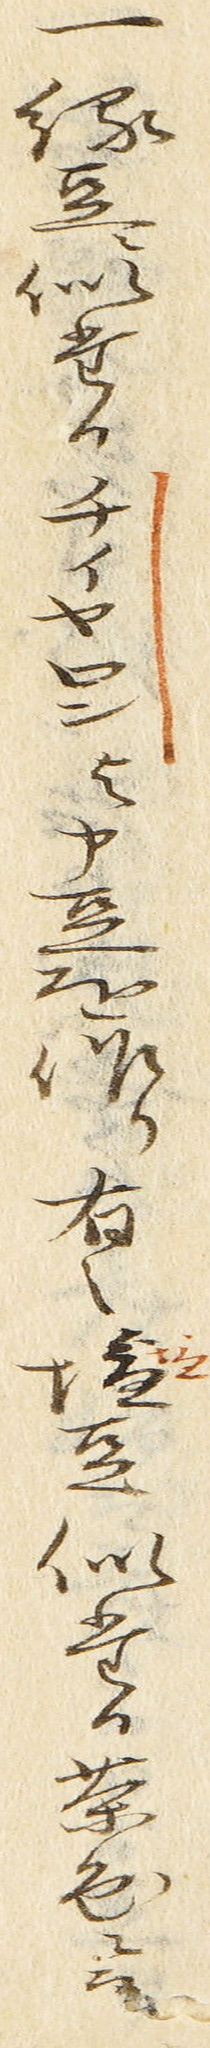一緑豆に似たるチイヤロンとも申豆を作り有之塩豆似たる茶色に而
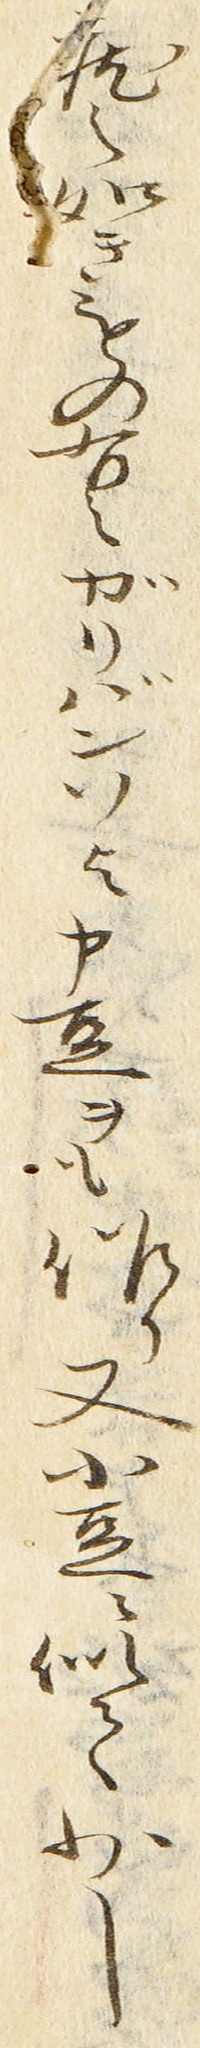？之如きもの有之ガリバンソと申豆も作り又小豆に似て少し
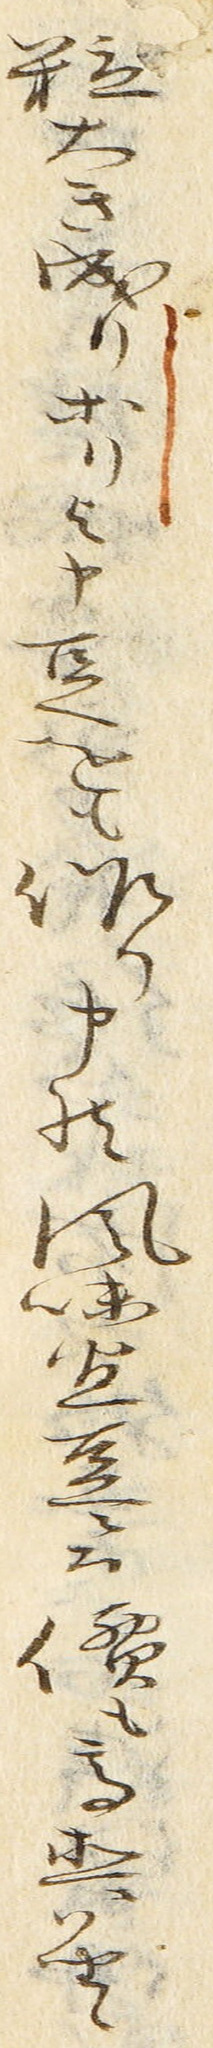粒大き成リホリと申豆をも作り申候風味宜豆に而価も高値に御座候
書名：漂流人弥市之記
